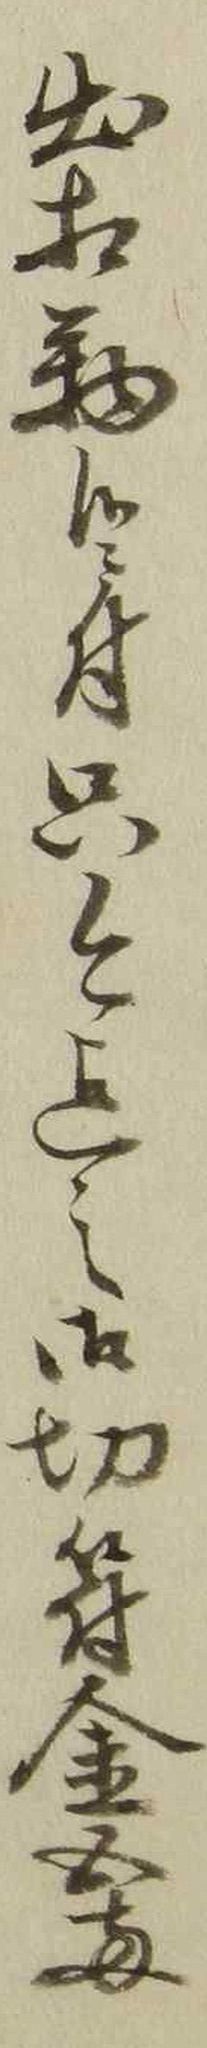出相勤候ニ付只今迄之御切符金五両
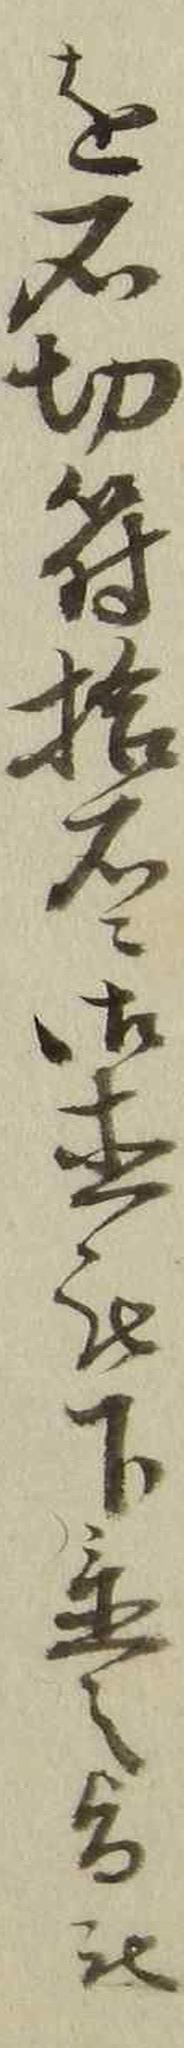を石切符拾石ニ御直被下置之旨被
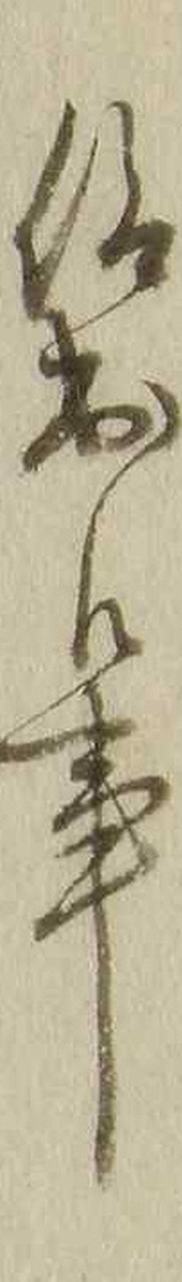仰出候事
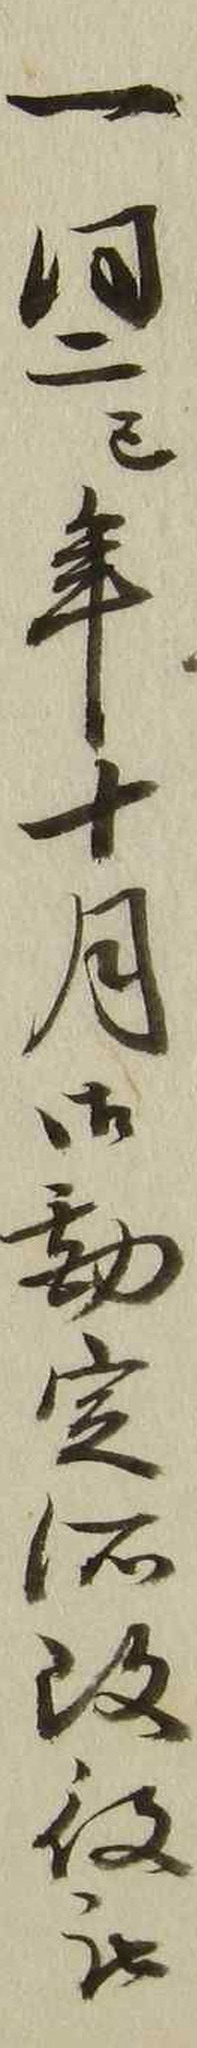一同二巳年十月御勘定所改役被
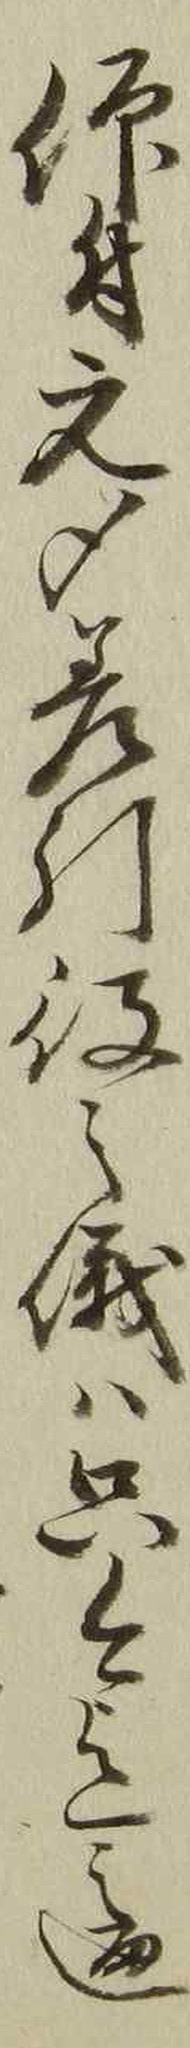仰付元〆差引役之儀ハ只今迄之通
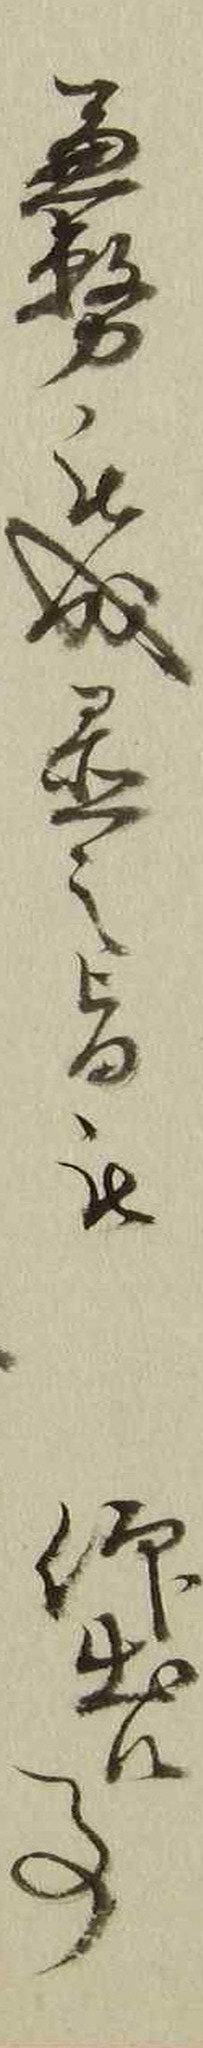兼務被成置之旨被仰出候事
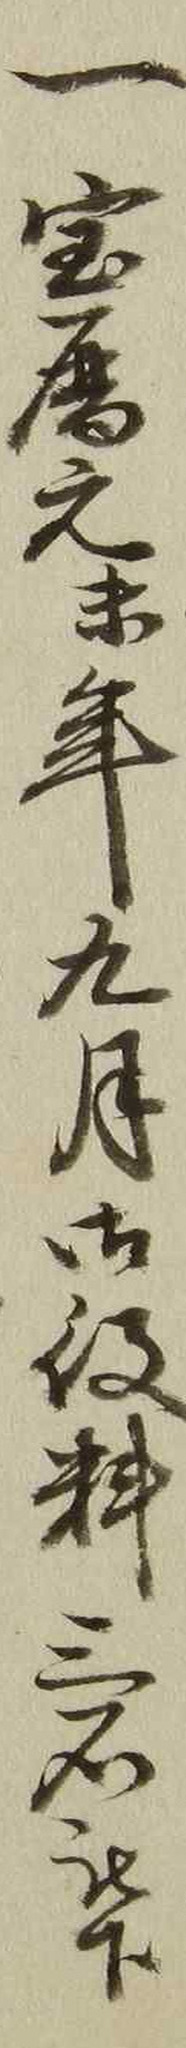一宝暦元未年九月御役料三石被下
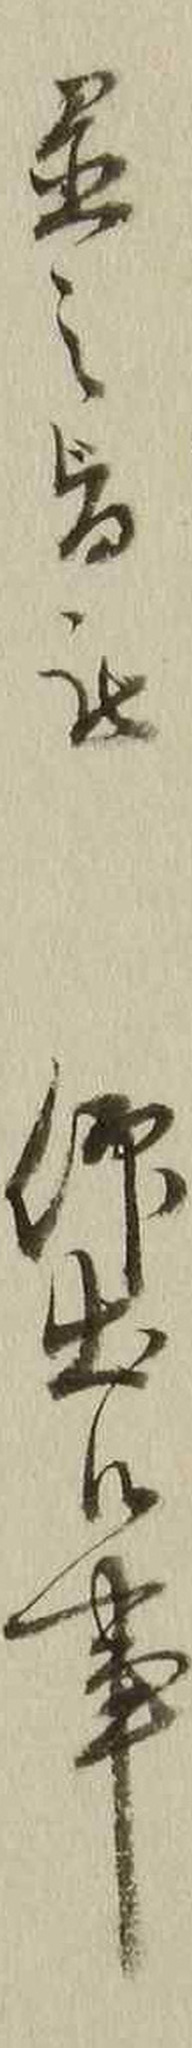置之旨被仰出候事
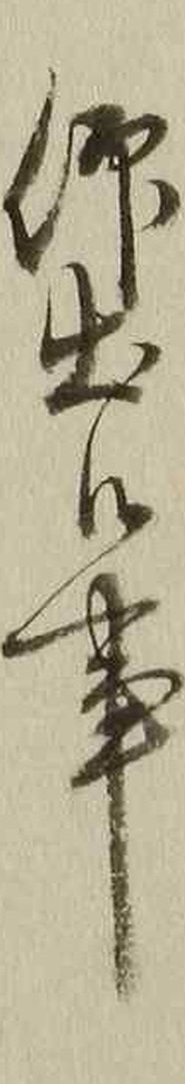仰出候事
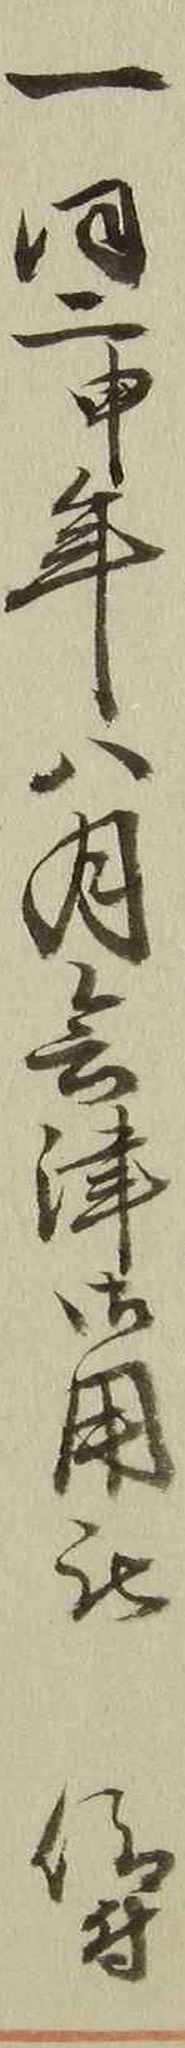一同二申年八月会津御用被仰付
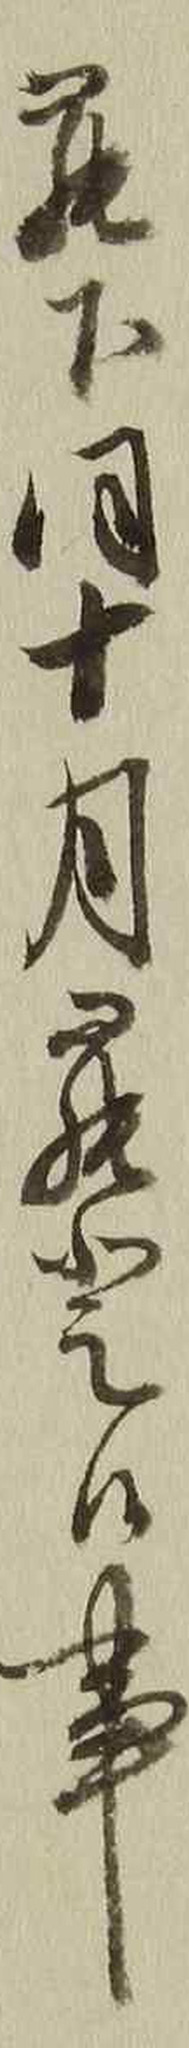罷下同十月罷登候事
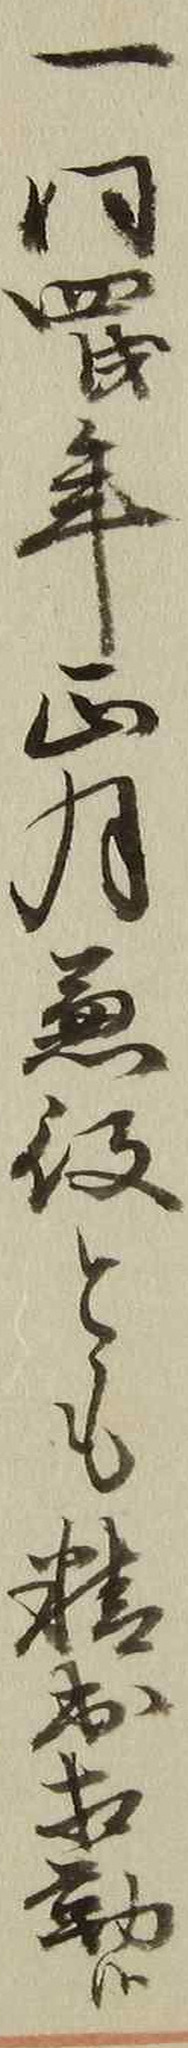一同四戌年正月兼役とも精出相勤候
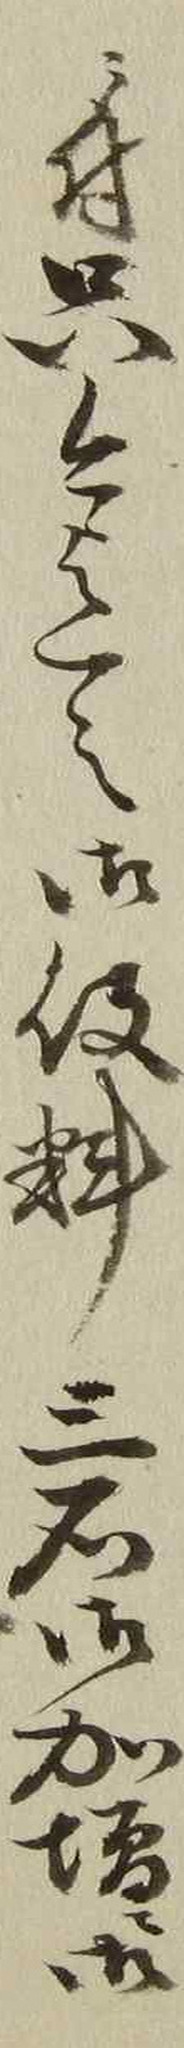ニ付只今迄之御役料三石御加増ニ御
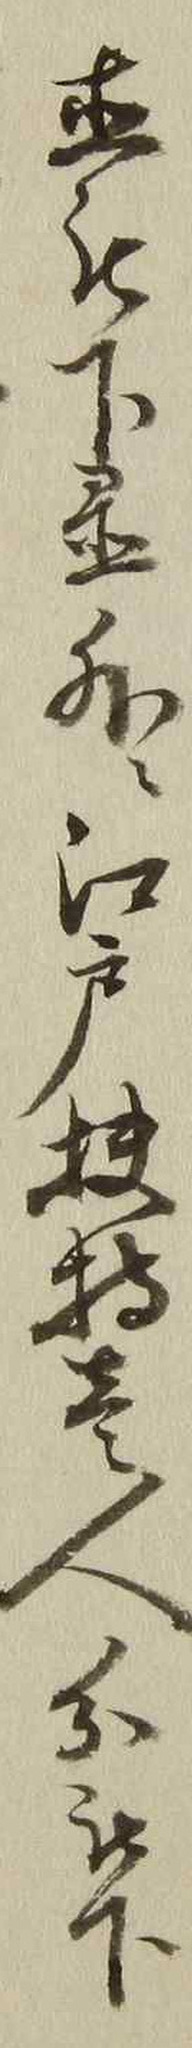直被下置外ニ江戸扶持壱人分被下
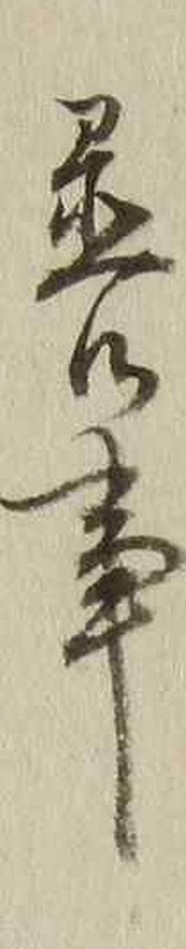置候事
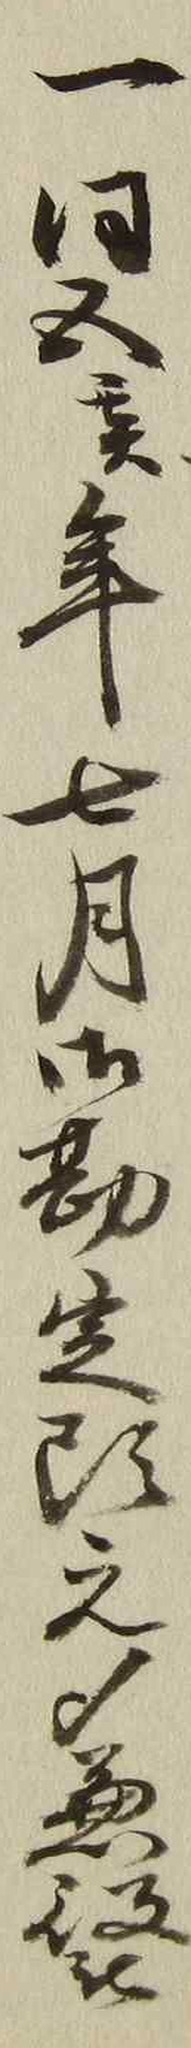一同五亥年七月御勘定頭元〆兼役被
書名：諸士系譜　巻之53　に之部4
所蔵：会津若松市立会津図書館
